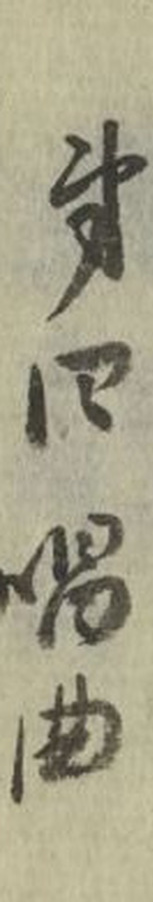第四唱曲
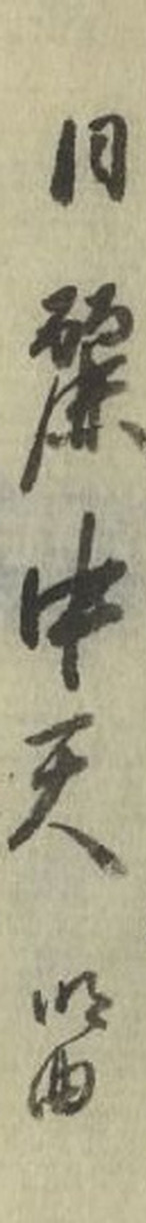日麗中天明曲
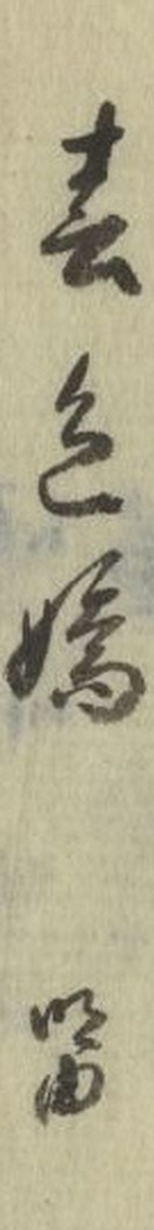春色嬌明曲
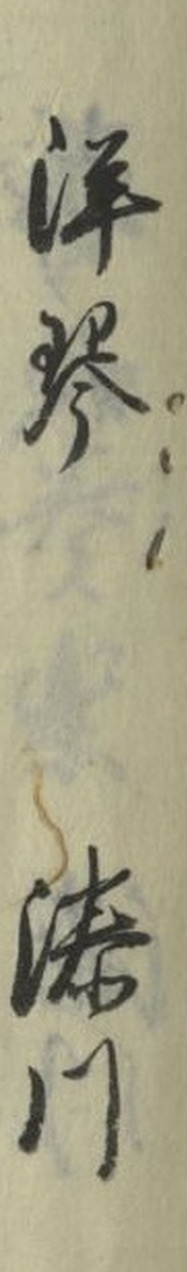洋琴湊川
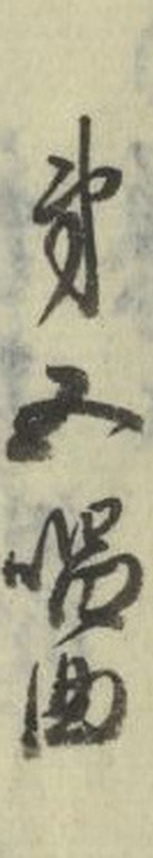第五唱曲
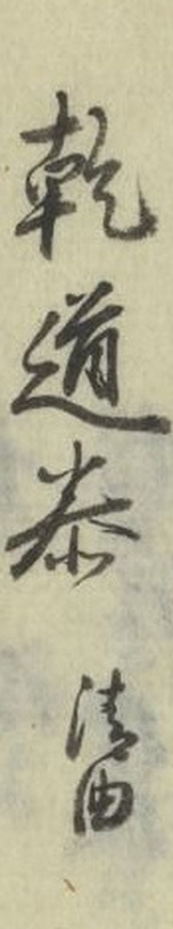乾道泰清曲
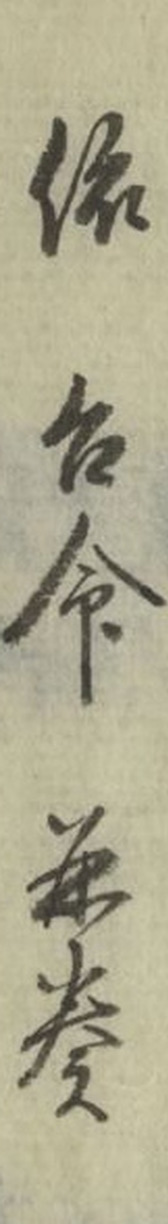依台命再奏
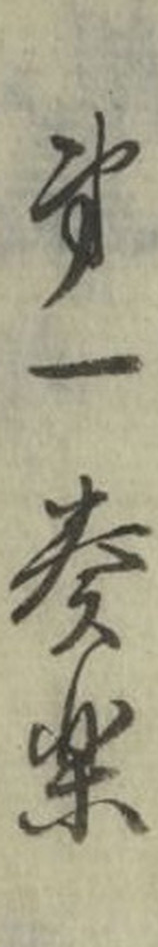第一奏楽

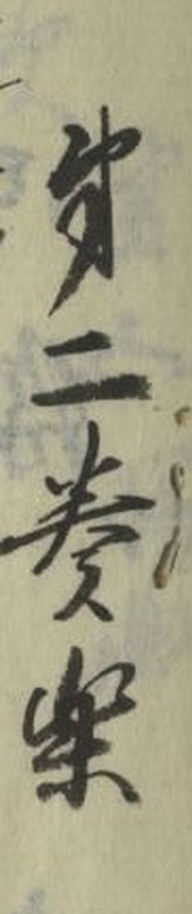第二奏楽
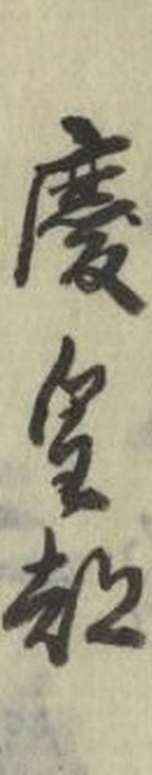慶皇都
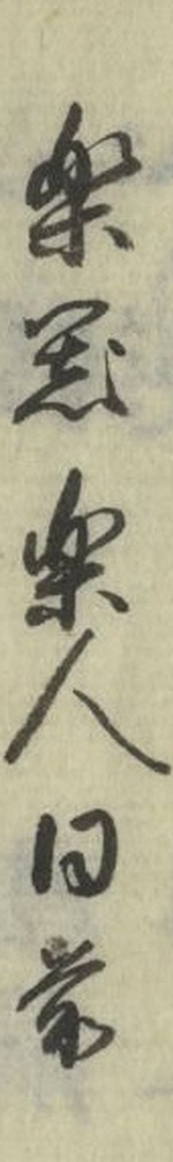楽器楽人同前
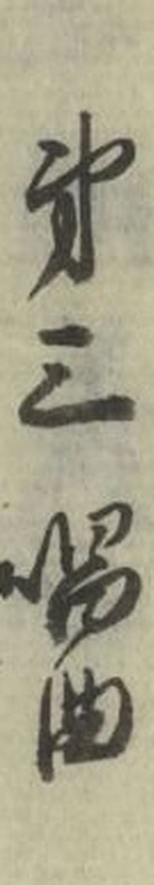第三唱曲
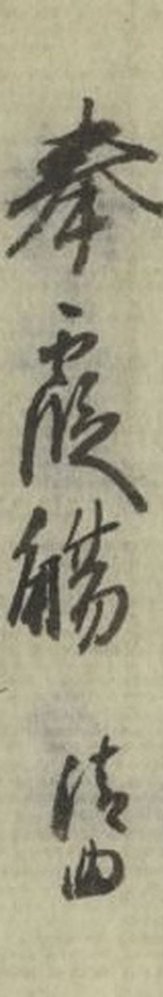奉霞觴清曲

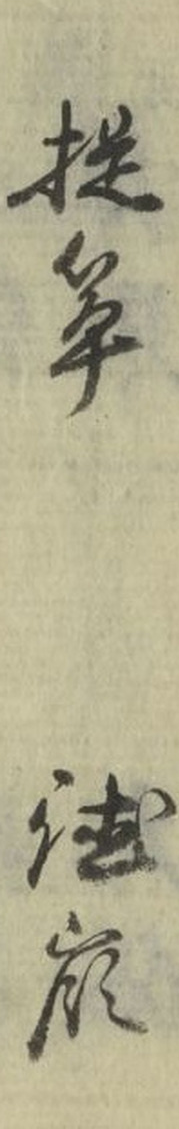提筝徳嶺
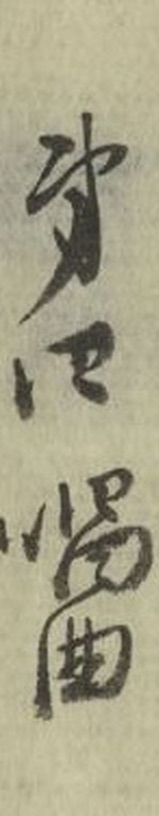第四唱曲
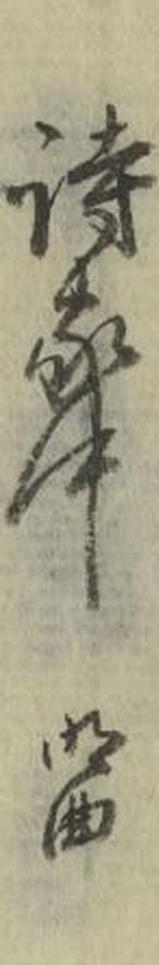詩家中明曲
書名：戊辰琉球人来朝之式 全
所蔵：University of the Ryukyus Library
